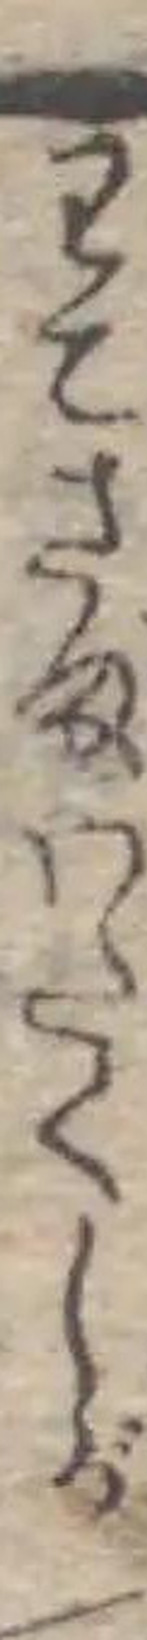わこさまわたくしが
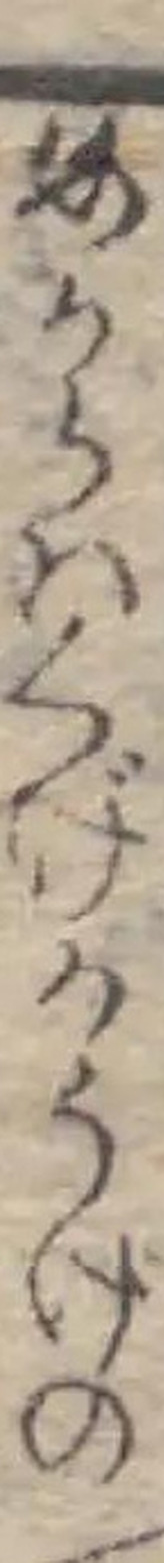めからはくげかうげの
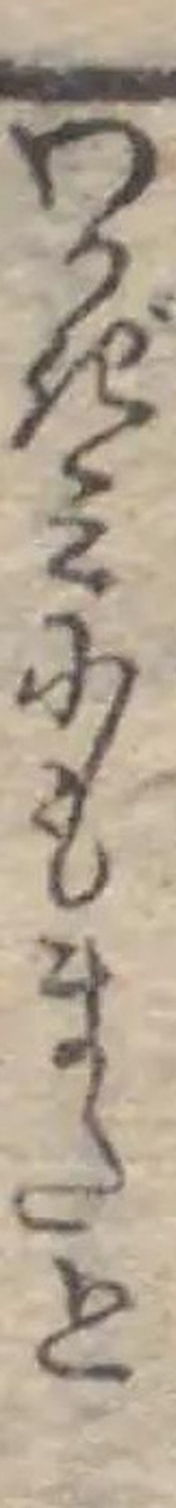わかぎみにもまたと
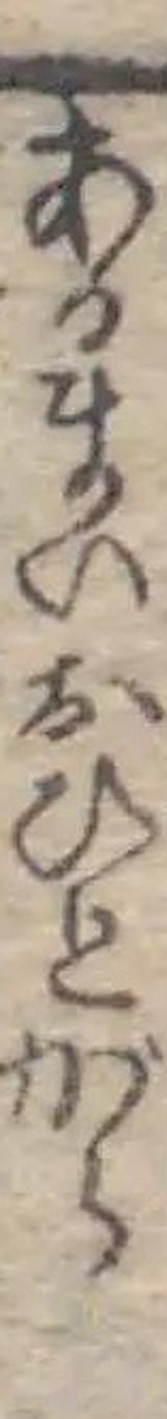あるまいおひとがら
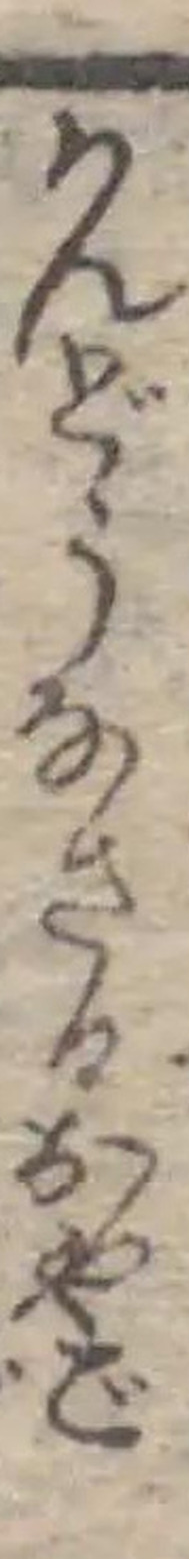かんどうなさるおやご
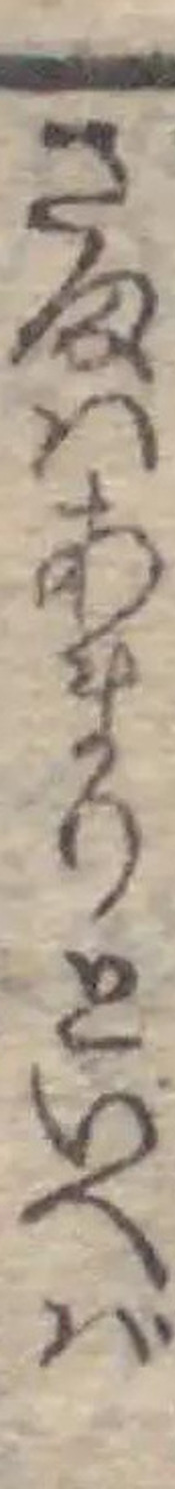さあはあまりといへば
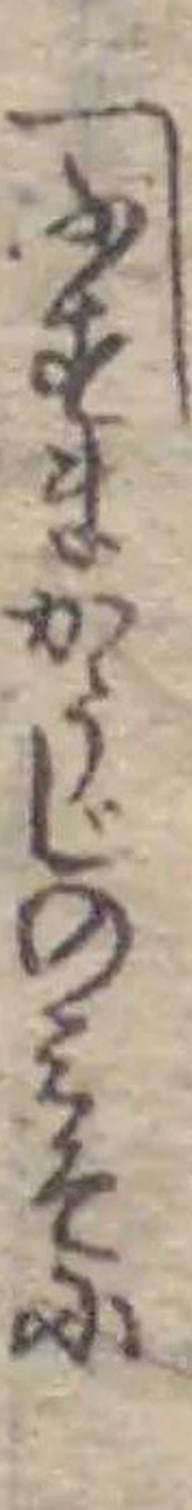〽ふすまかうじのみそに
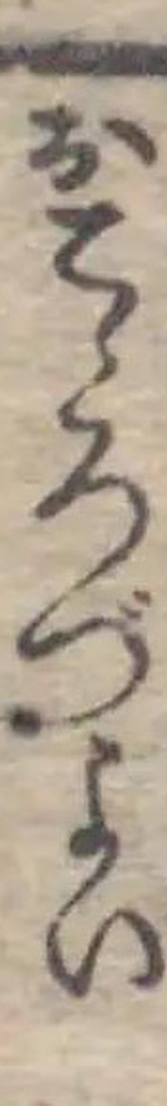おこゝろづよい
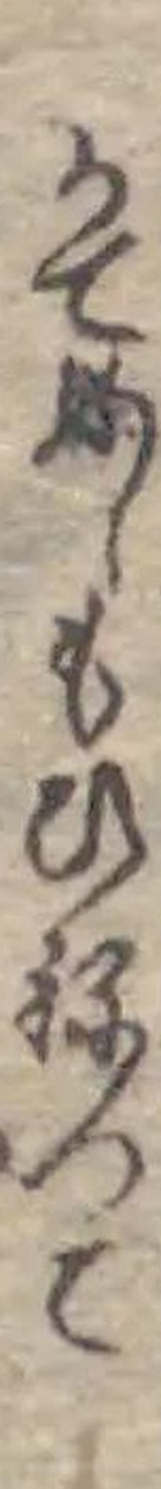かてめしもひねつて

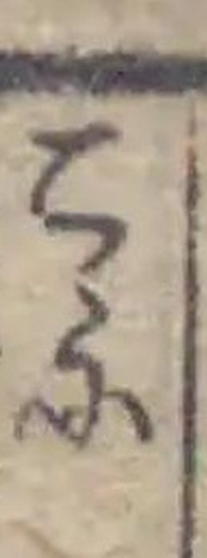こゝに
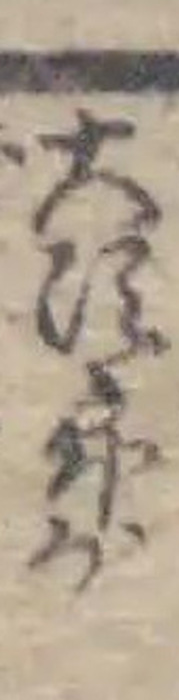大次郎が
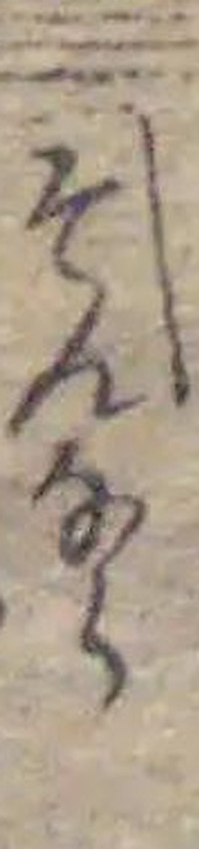〽そんなら
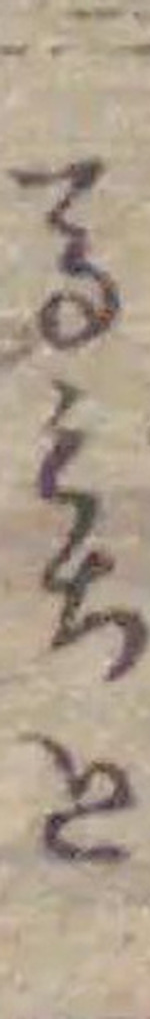馬もちと
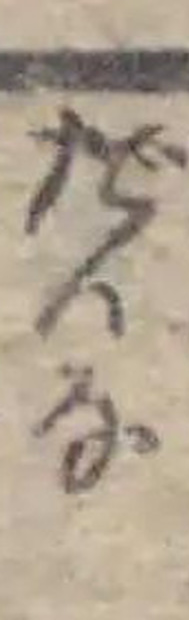だんな
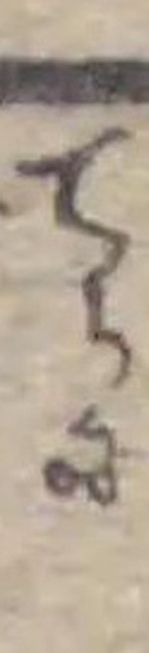てらに
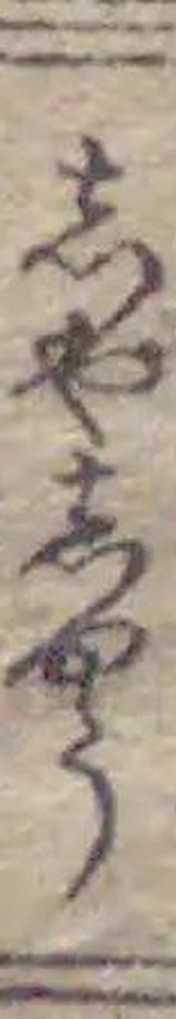しやしやう
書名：福壽海旡量品玉 3巻
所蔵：国立国会図書館 National Diet Library, JAPAN
